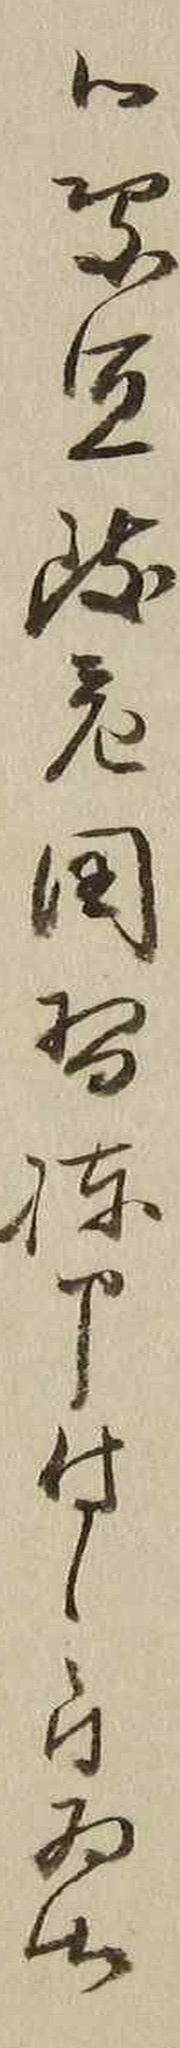候処宜致指図習練申付候に付為御
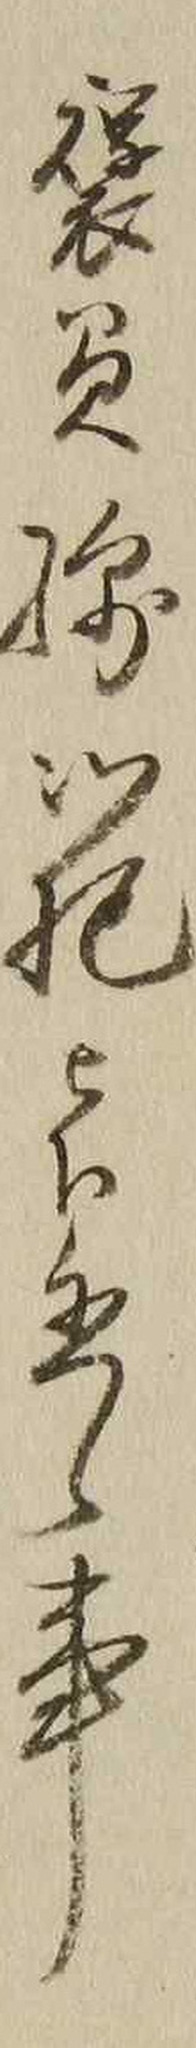褒美綿弐把被下置候事
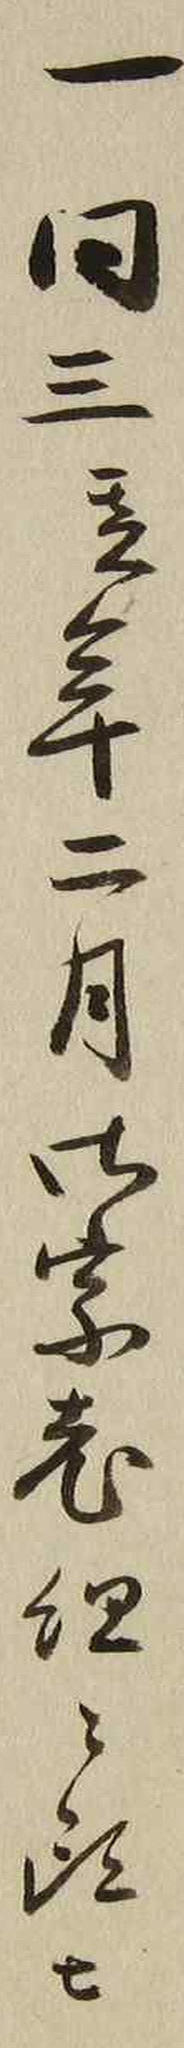一同三亥年二月御家老組之頭被
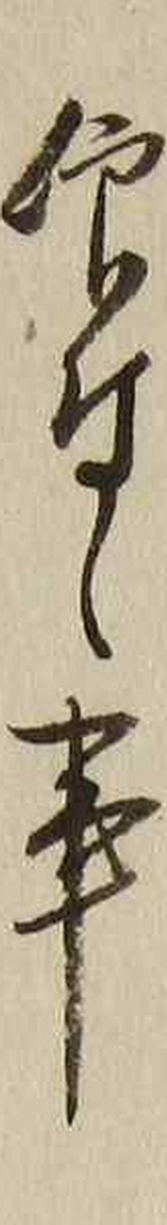仰付候事
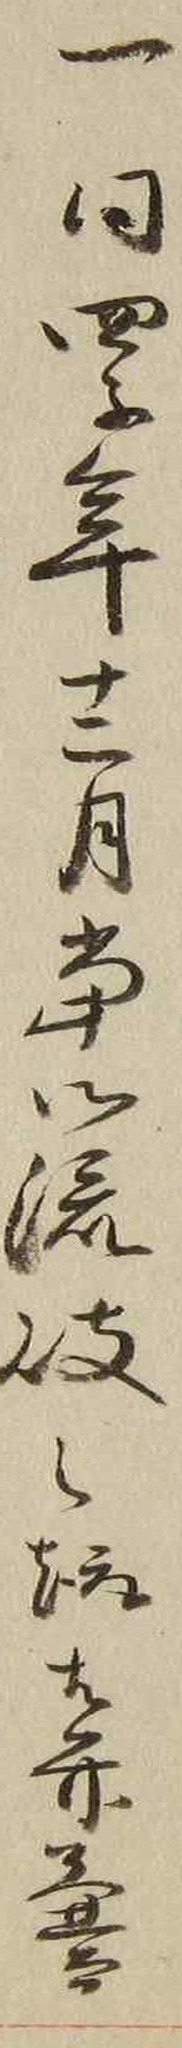一同四子年十二月当御流岐之趣相弁兼而
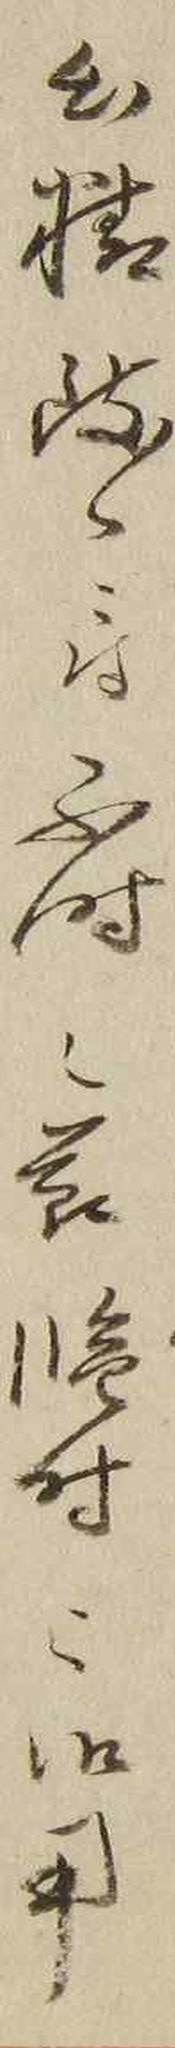出精致候に付不時之節臨時之御用
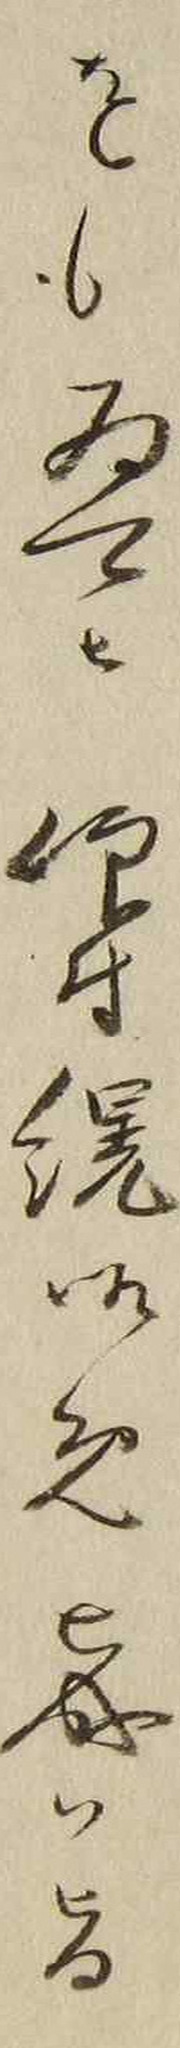をも為可被仰付縨御免被成候旨
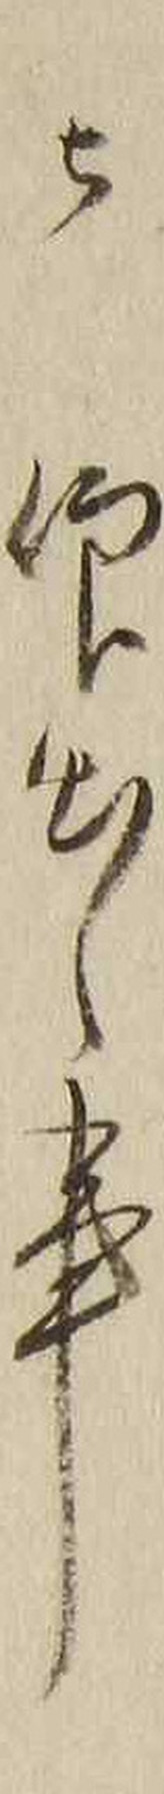被仰出候事
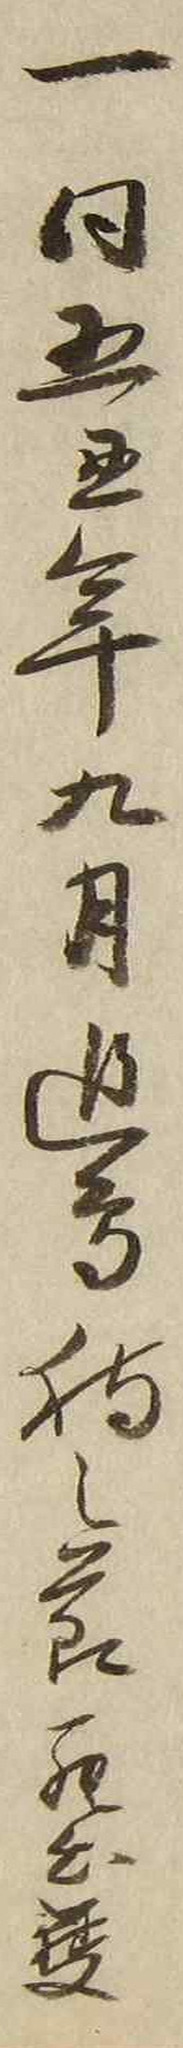一同五丑年九月追鳥狩之節罷出変

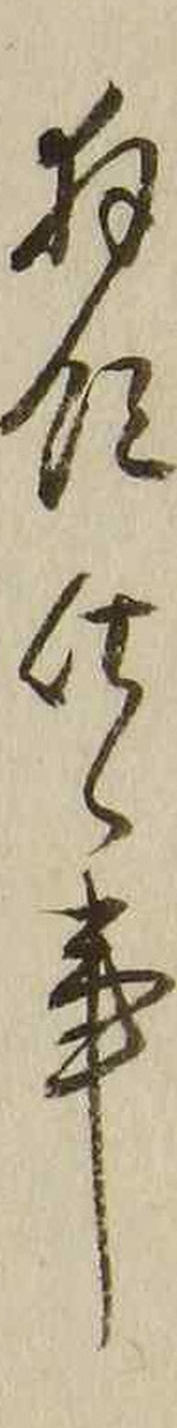狩餌仕候事
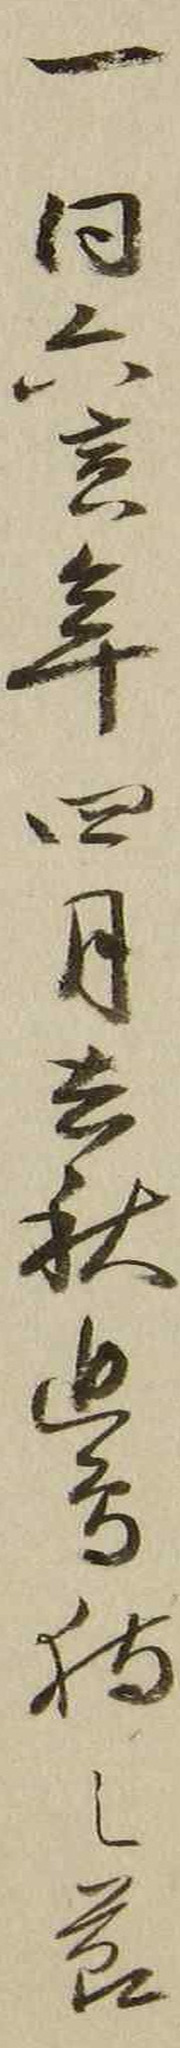一同六寅年四月去秋追鳥狩之節
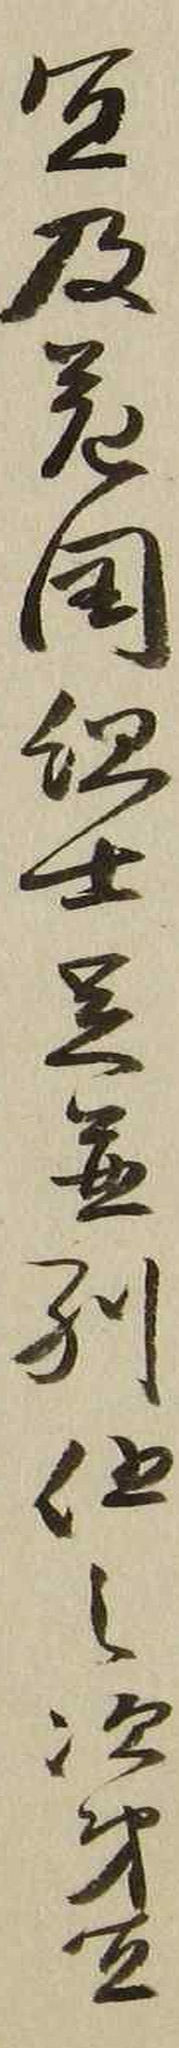宜及指図組士足並列伍之次第宜
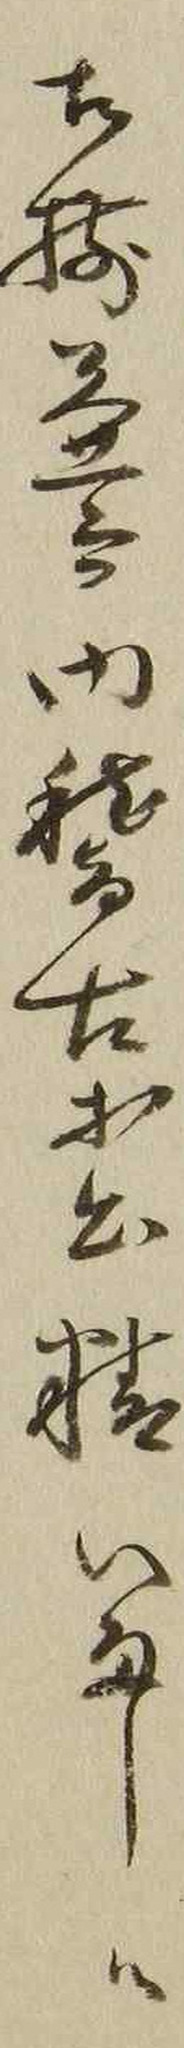相揃兼而内稽古等出精いたし候
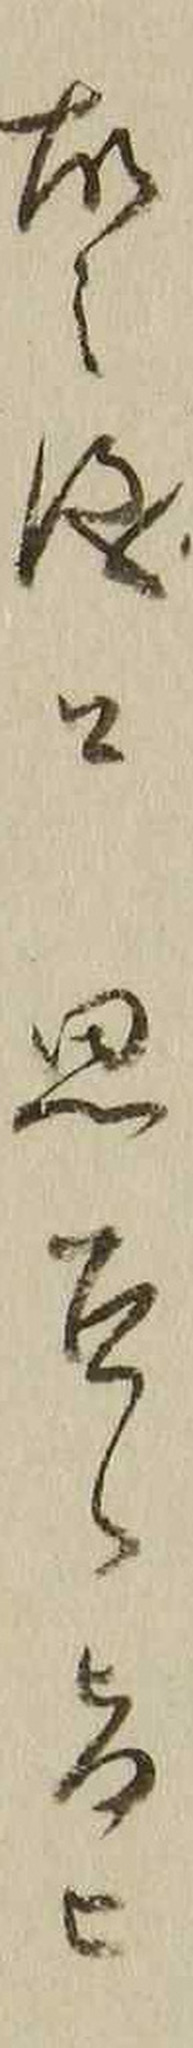故之儀被思召候旨被
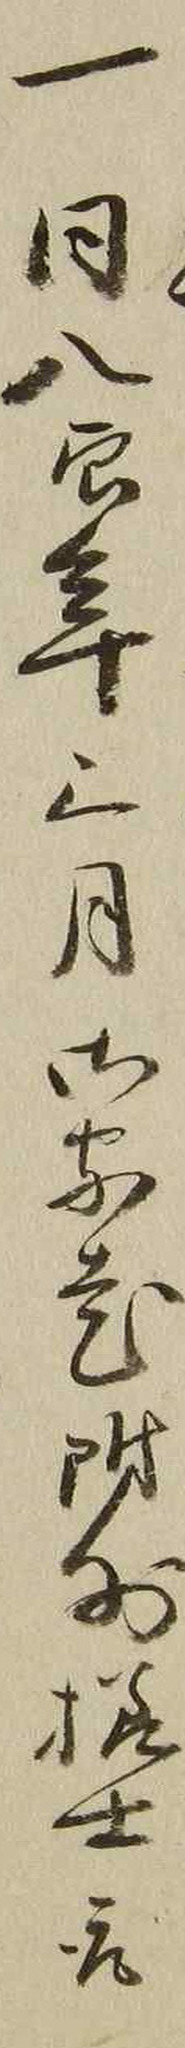一同八辰年三月御家老附外様士取
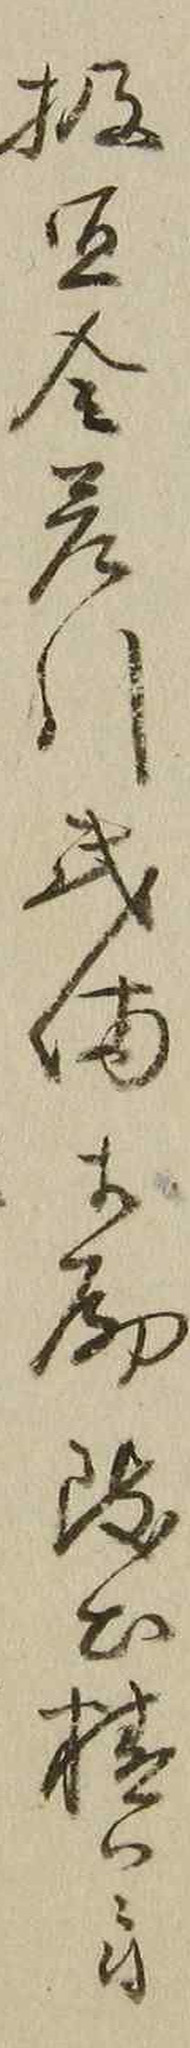扱宜全差引武備相勤致出精候に付
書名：諸士系譜　巻之269　さ之部1
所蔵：会津若松市立会津図書館
